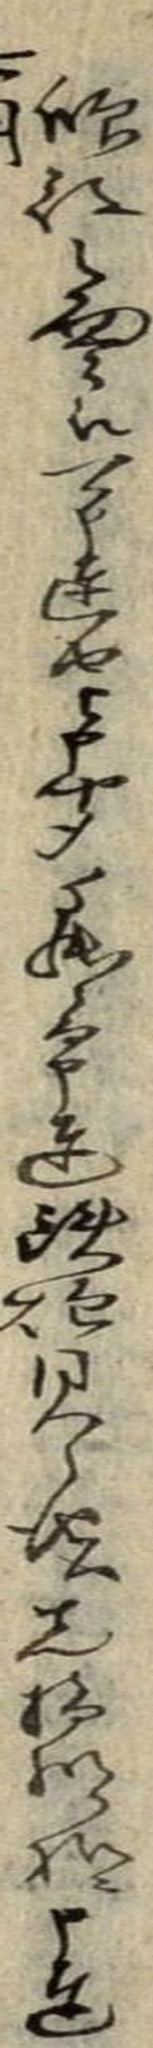師役之面々え可申達由被申聞手紙にて申達鉄炮貝之儀は先指扣候様に申達
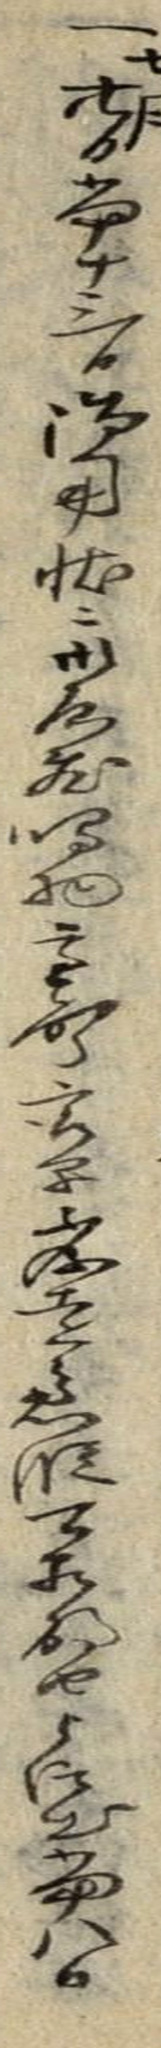ホ一七月廿日当十三日御用状に御屋敷鳴物高声最早不及遠慮段可相触由被仰出当八日
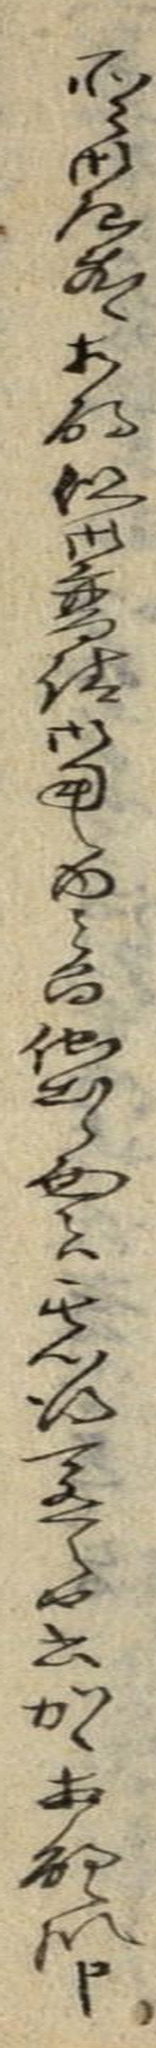所々御屋敷へ相触但御普請御用之内に候間他出之面々は其心得可有之由書加へ相触候段申
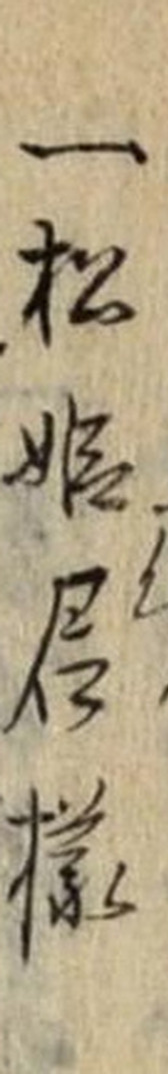一松姫君様
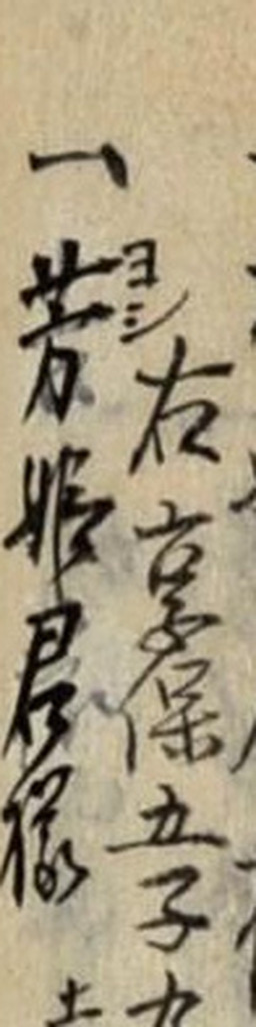一松姫君様
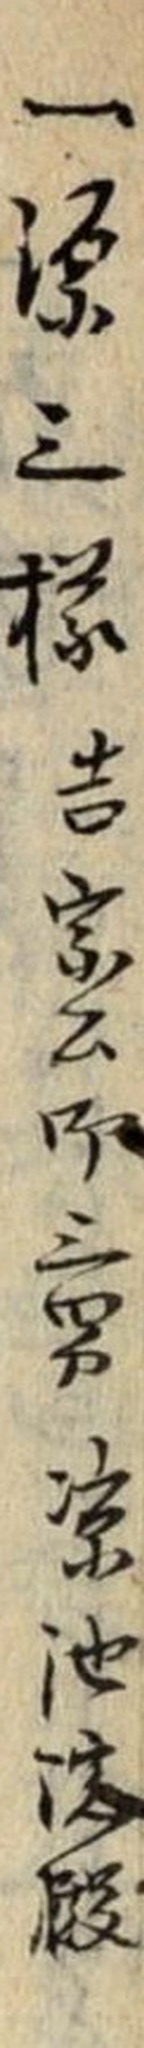一源三様吉宗公御三男涼池院殿
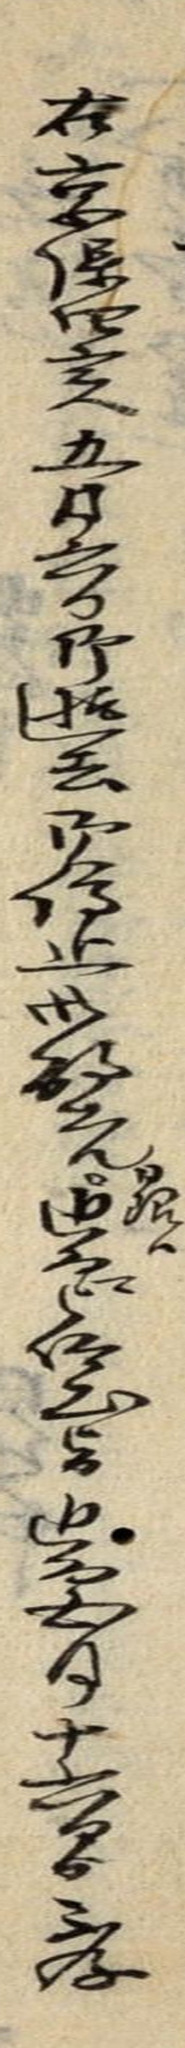右享保四亥五月六日御逝去御停止御触出ル◦追て日限は可被仰出旨追て五月十六日ゟ不及
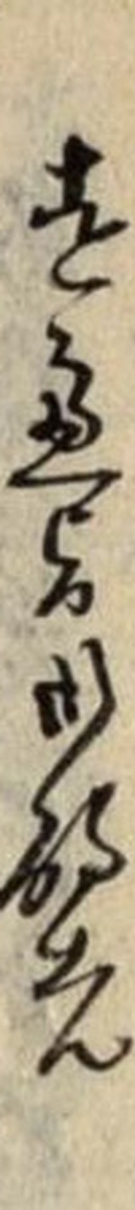遠慮旨御触出ル
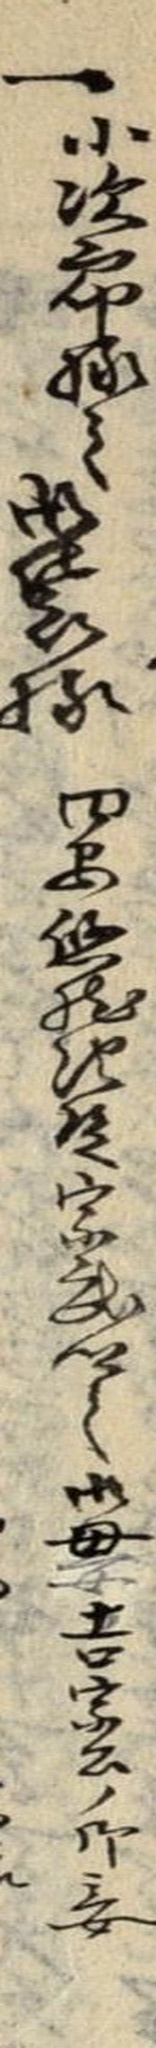一小次郎様之御袋様田安悠然院殿宗成卿之御母吉宗公ノ御妾
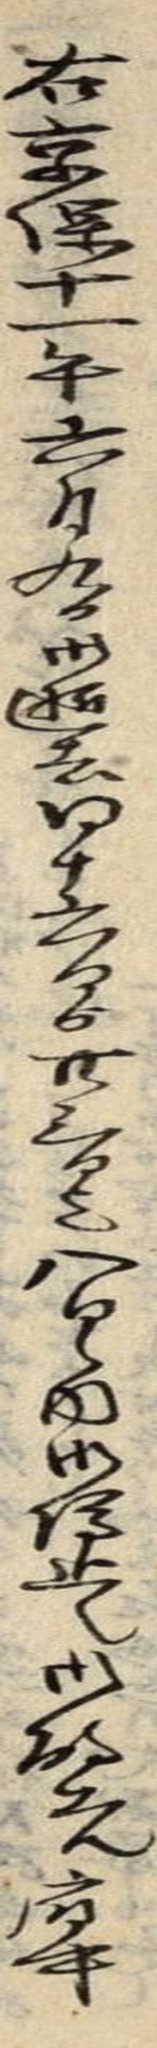右享保十一午六月九日御逝去同十六日ゟ廿三日迄八日之内御停止之御触出ル府中
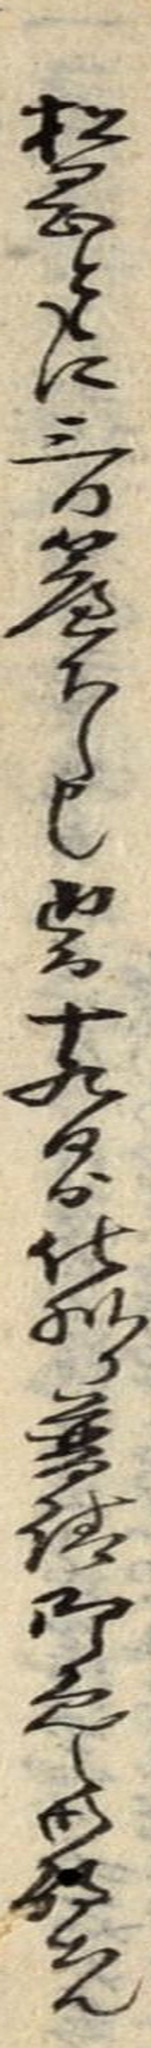松岡ともに三日簾下し申候追て十九日ゟ仕掛り普請御免之御触出ル
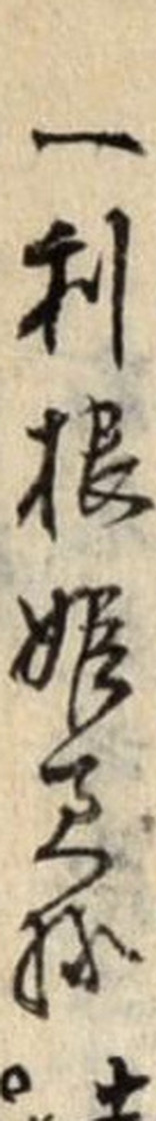一松姫君様
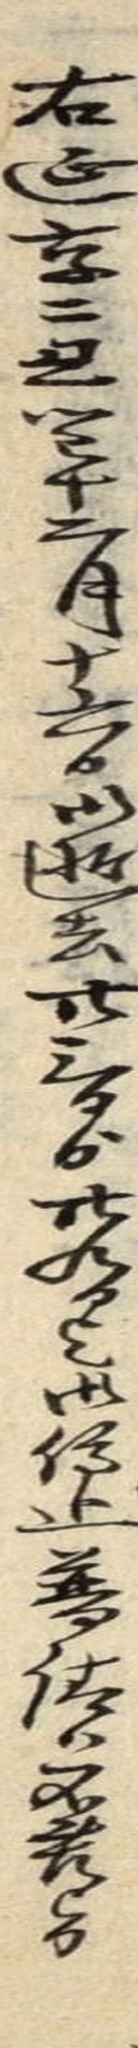右延享二丑閏十二月十六日御逝去廿三日ゟ廿九日迄御停止普請は不苦旨
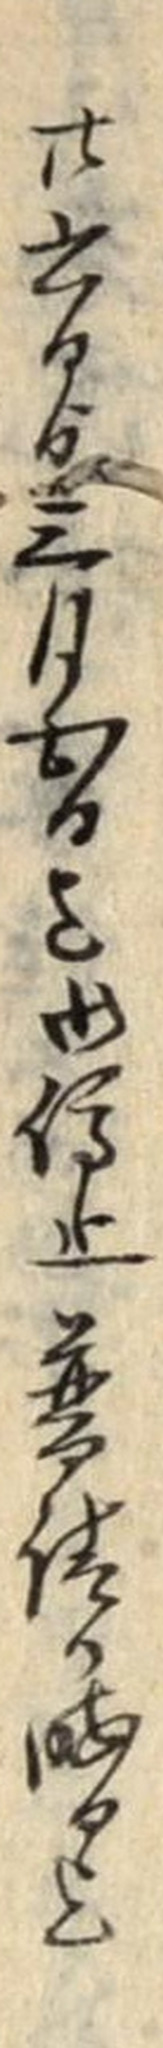廿六日ゟ三月五日迄御停止普請は晦日迄

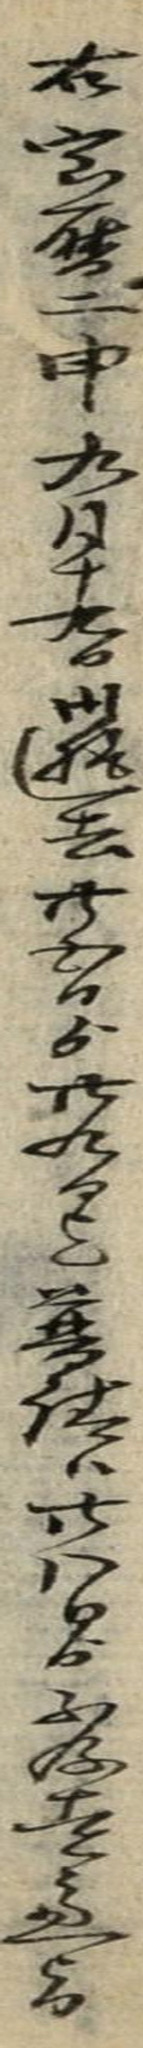右宝暦二申九月十九日御逝去廿五日ゟ廿九日迄普請は廿八日ゟ不及遠慮旨
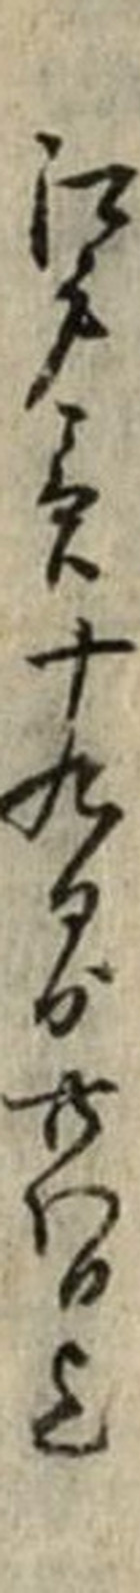江戸にては十九日ゟ廿八日迄
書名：御停止異変死失
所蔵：福井県文書館 Fukui Prefectural Archives
